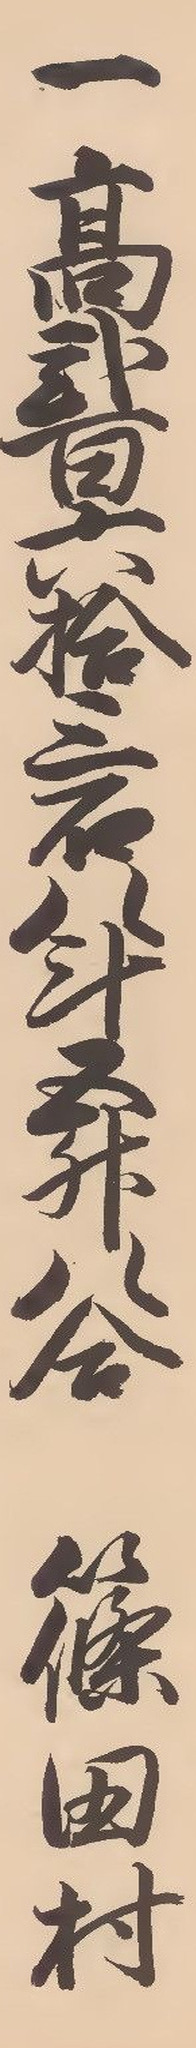一高弐百六拾三石八斗五升八合篠田村
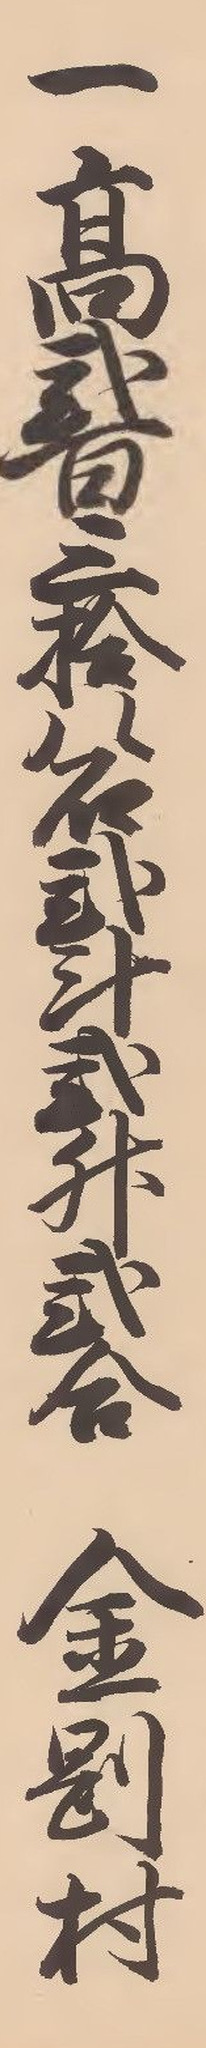一高弐百三拾八石弐斗弐升弐合金剛村
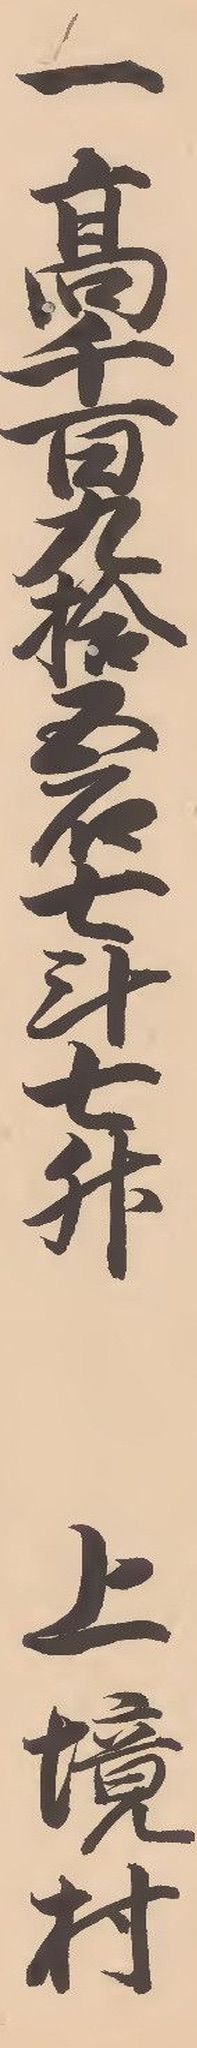一高千百九拾五石七斗七升上境村
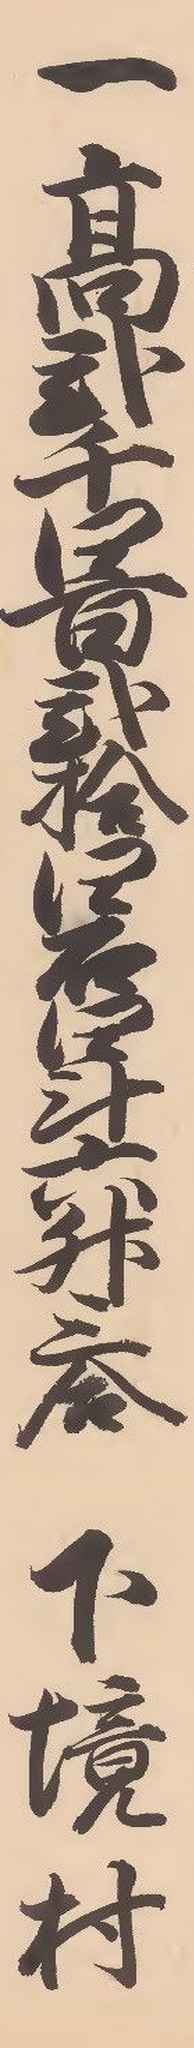一高弐千四百弐拾四石四斗六升三合下境村

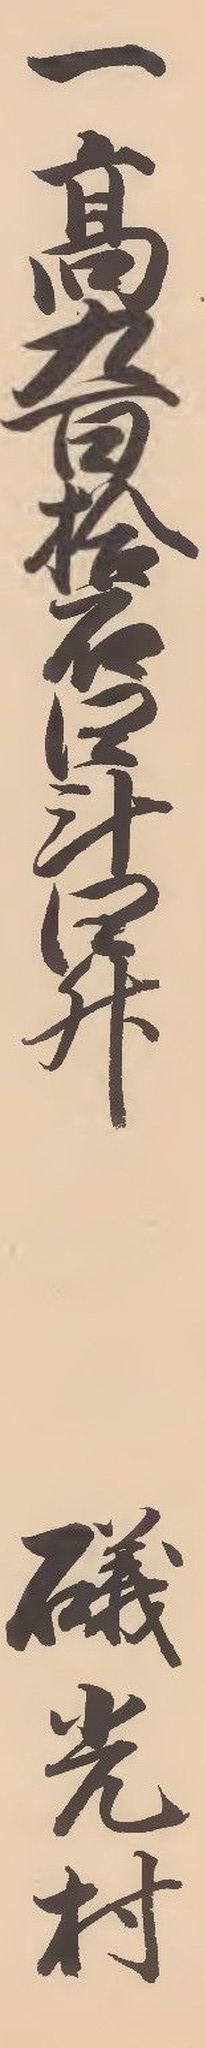一高九百拾石四斗四升磯光村
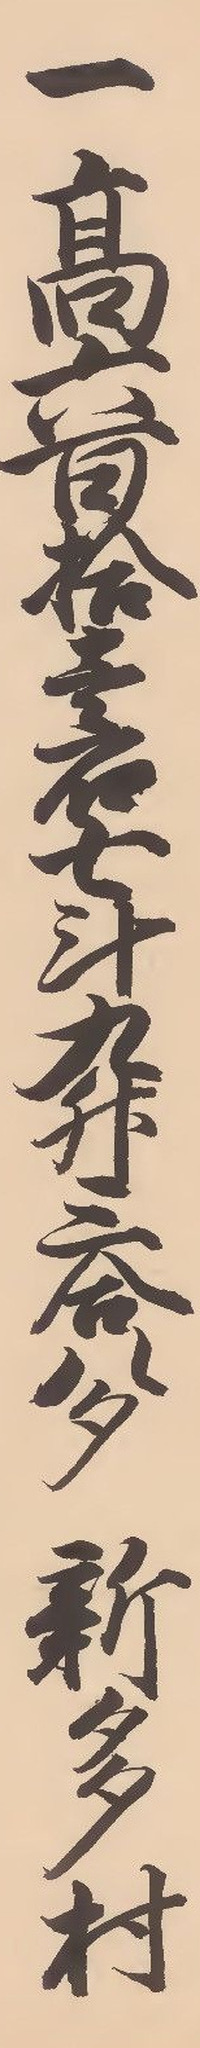一高六百拾壱七斗九升三合八勺新多村
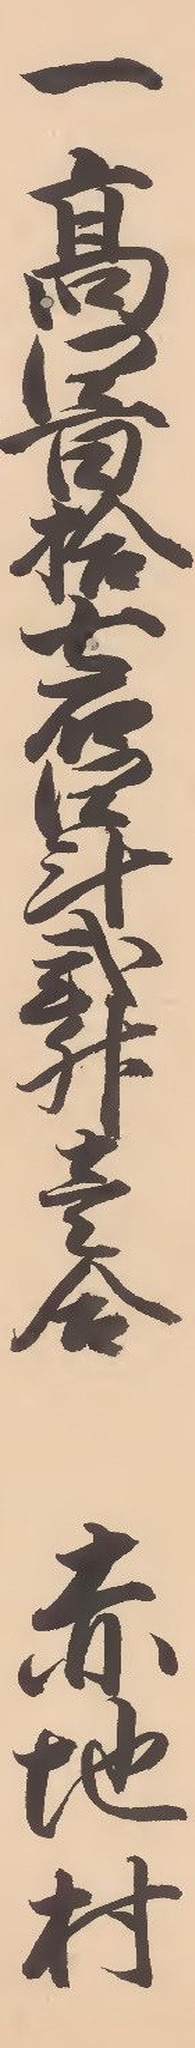一高四百拾七石四斗弐升壱合赤地村
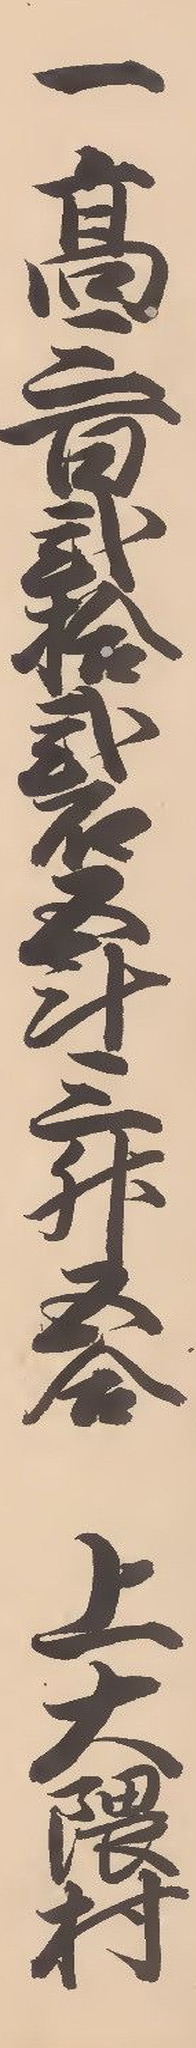一高三百弐拾弐石五斗三升五合上大隈村
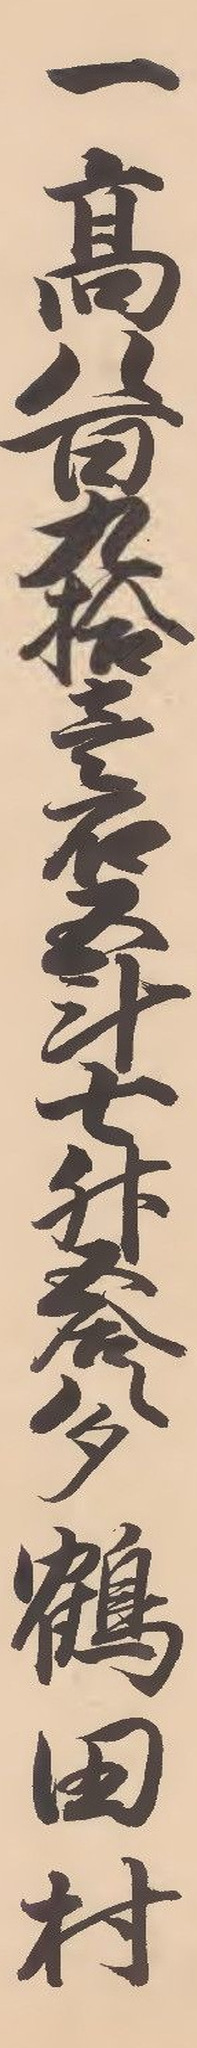一高八百九拾壱石五斗七升五合八勺鶴田村
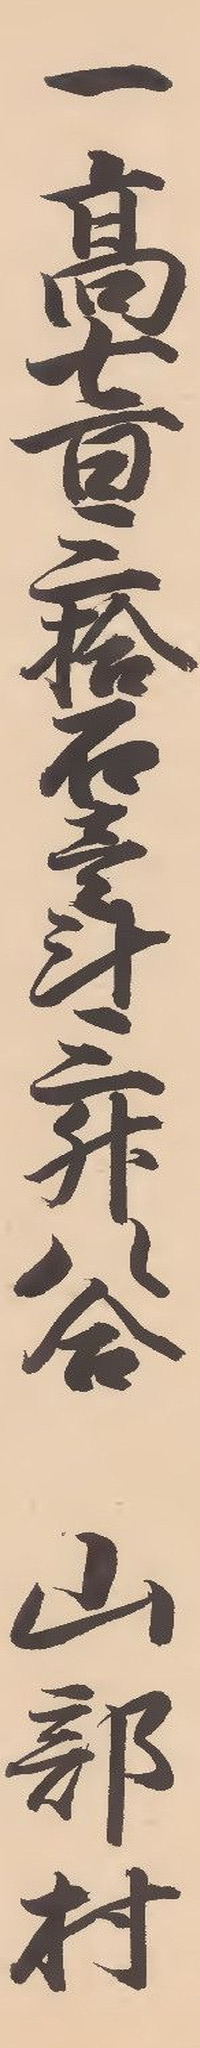一高七百三拾石壱斗三升八合山部村

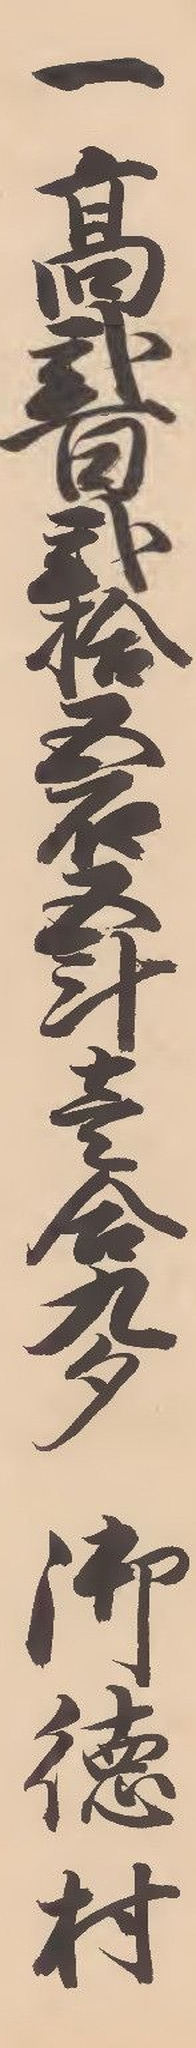一高弐百弐拾五石五斗壱合九勺御徳村
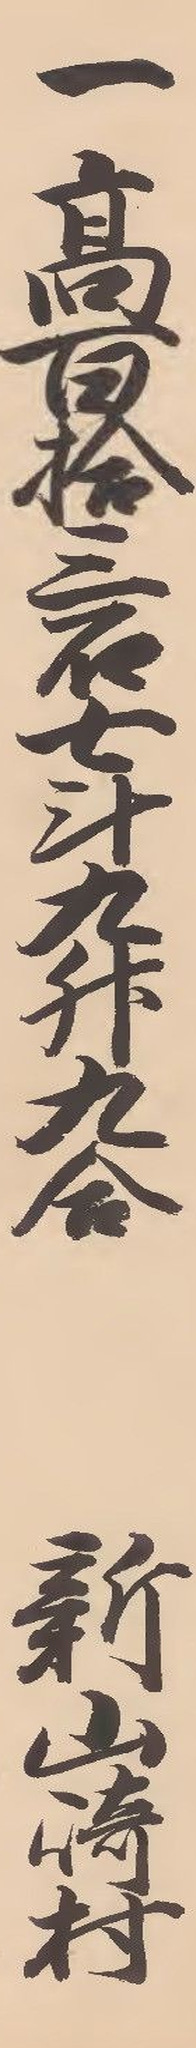一高百拾三石七斗九升九合新山崎村
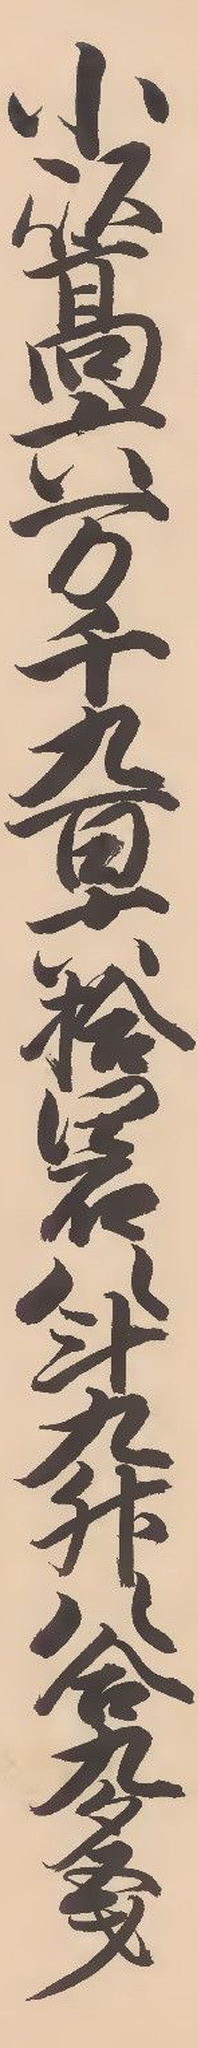小以高六万千九百六拾四石八斗九升八合九勺五才
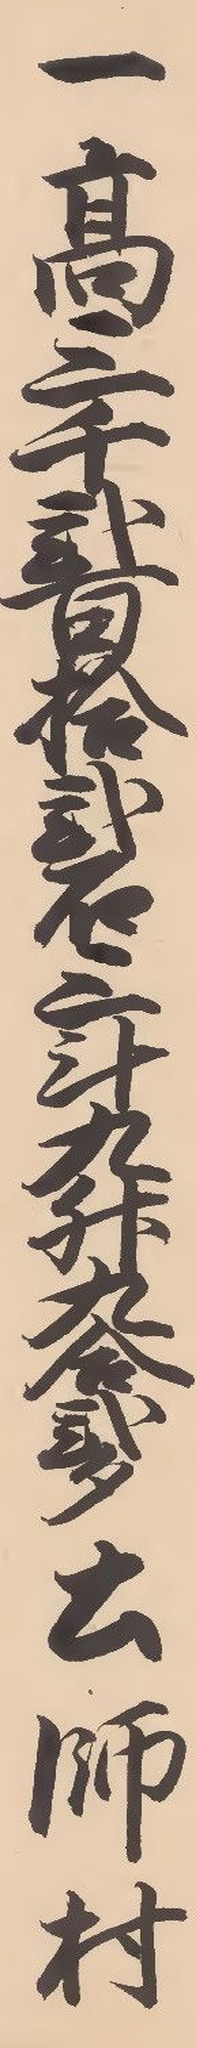一高三千弐百拾弐石三斗九升九合弐勺土師村
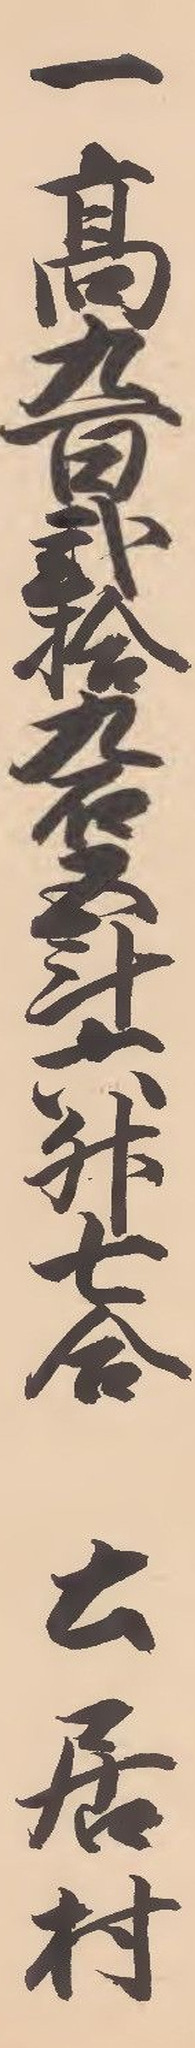一高九百弐拾九石五斗六升七合土居村
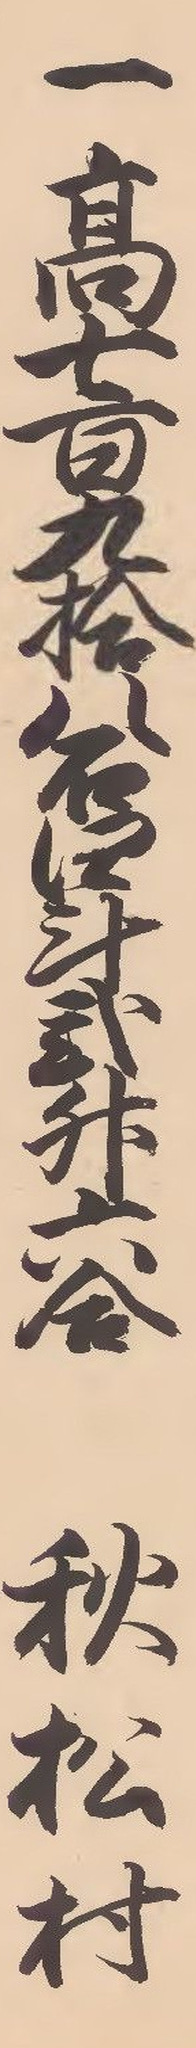一高七百九拾八石四斗弐升六合秋松村
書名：筑前国郷帳
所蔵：国立公文書館 National Archives of Japan
